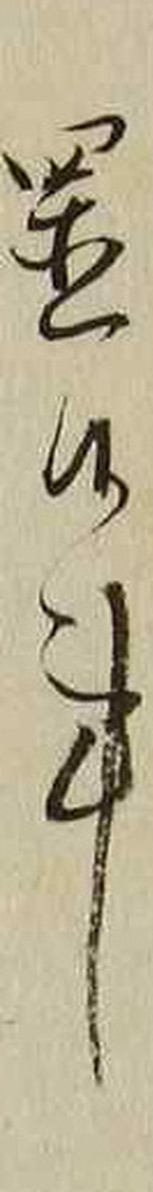置候事
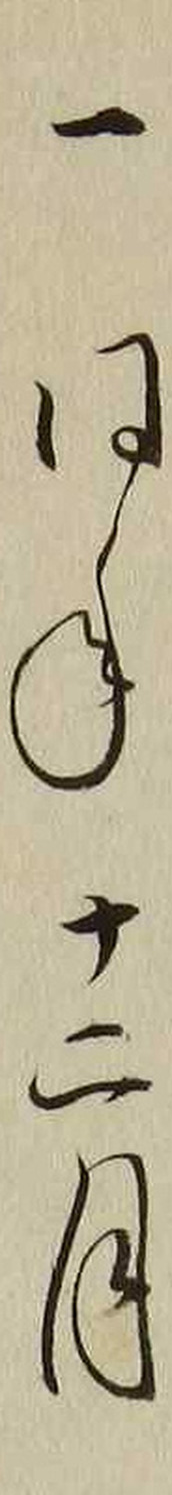一同年十二月
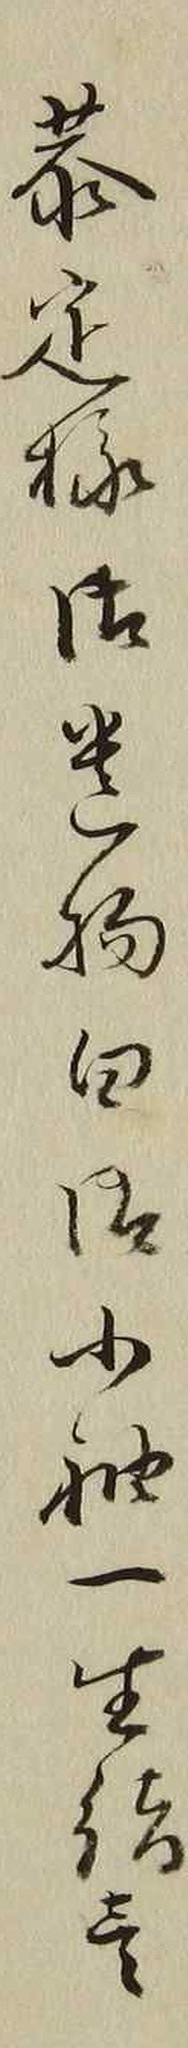恭定様御遺物白御小袖一生絹壱
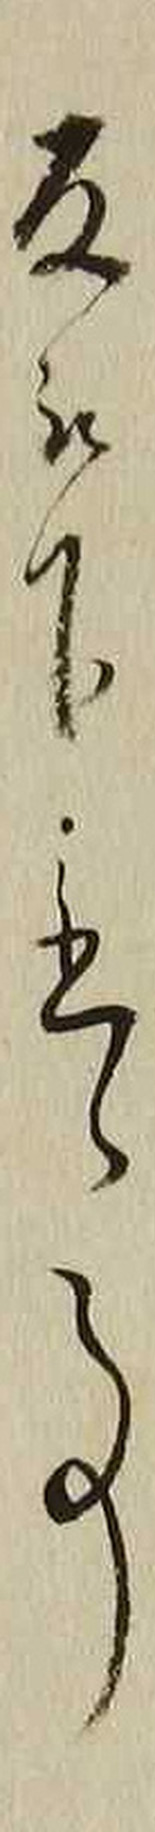反被下置候事
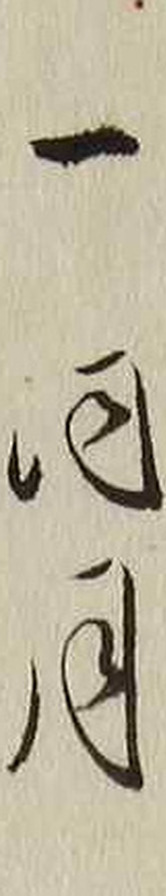一同月
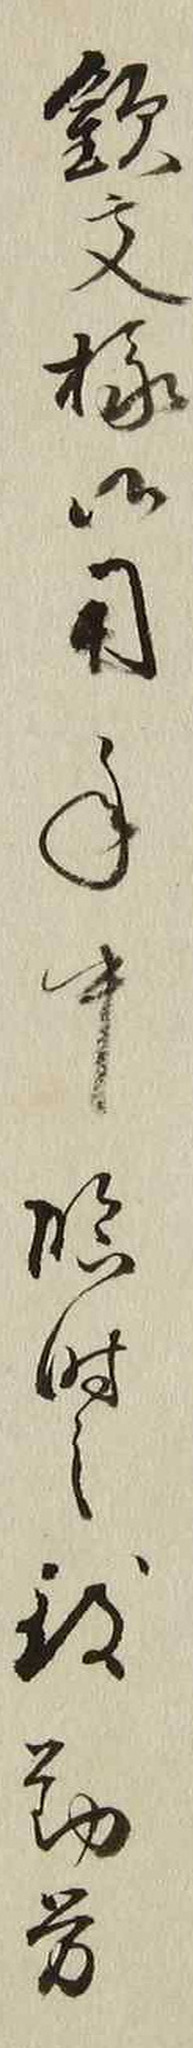欽文様御用年中臨時之致勤労
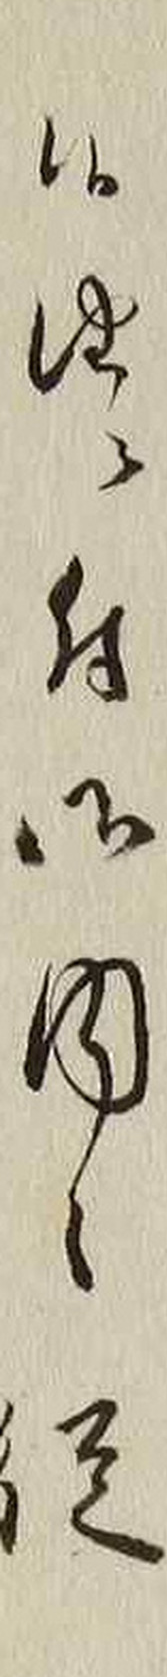候由付御内々従
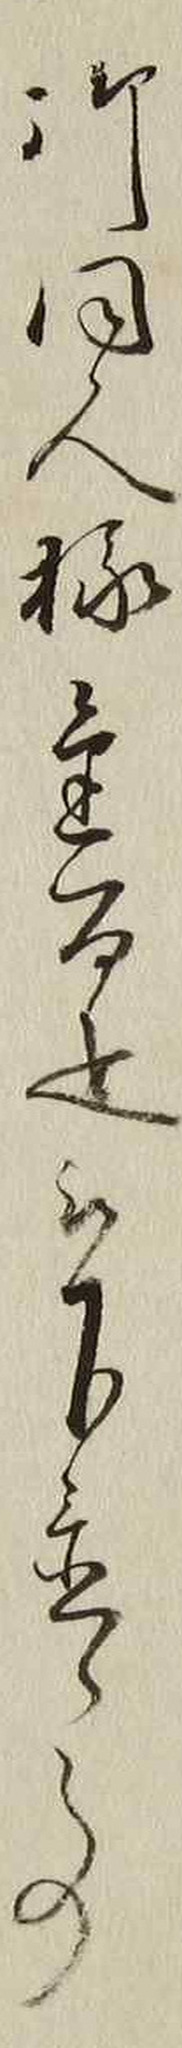御同人様金百疋被下置候事
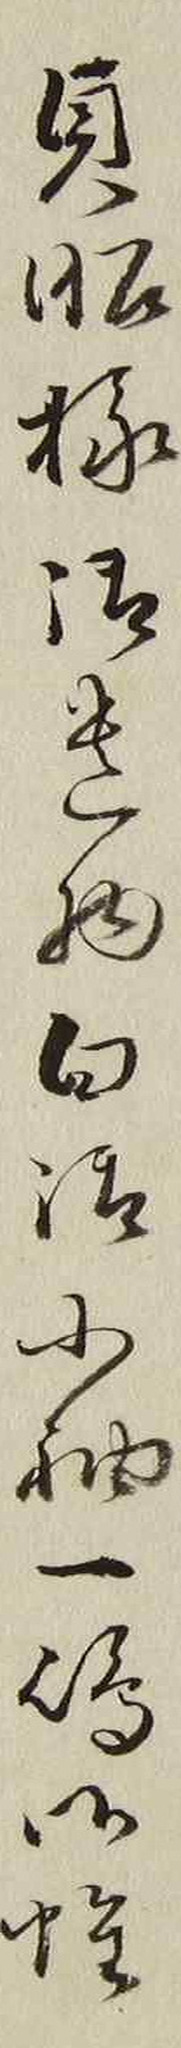貞昭様御遺物白御小袖一嶋御帷
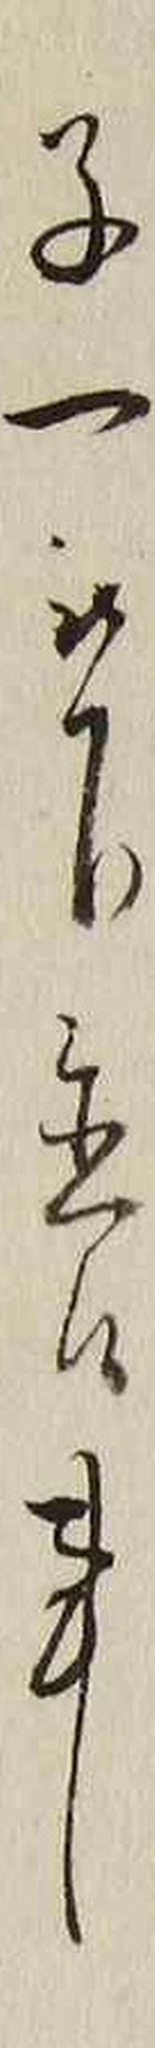子一被下置候事
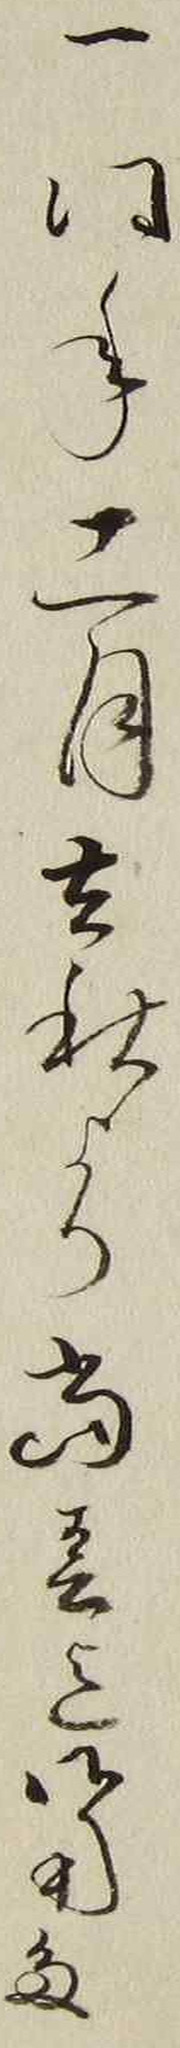一同年十一月去秋より当春迄御用多
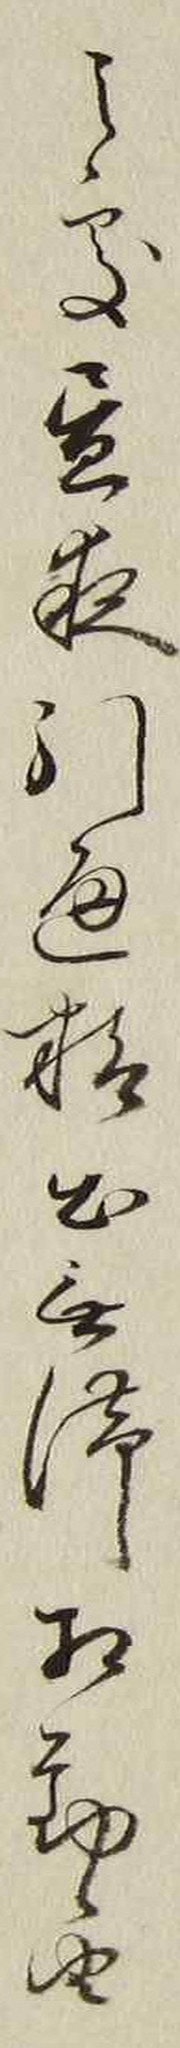之処昼夜引通精出無滞相勤候由

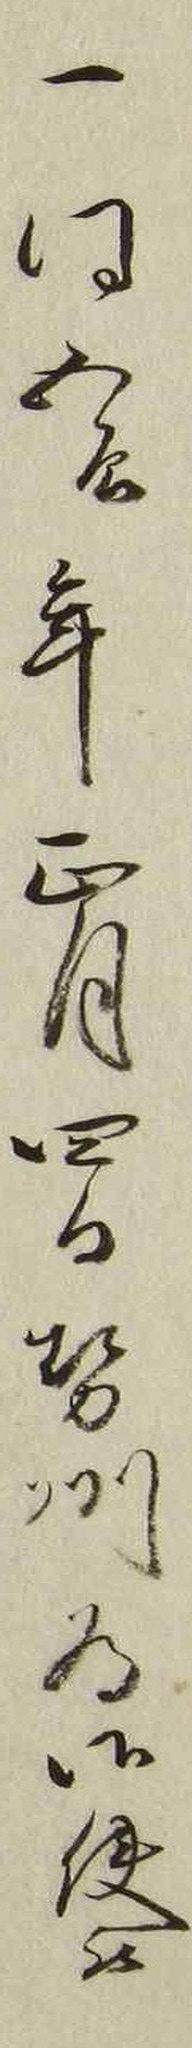一同五辰年正月四日勢州為御使被
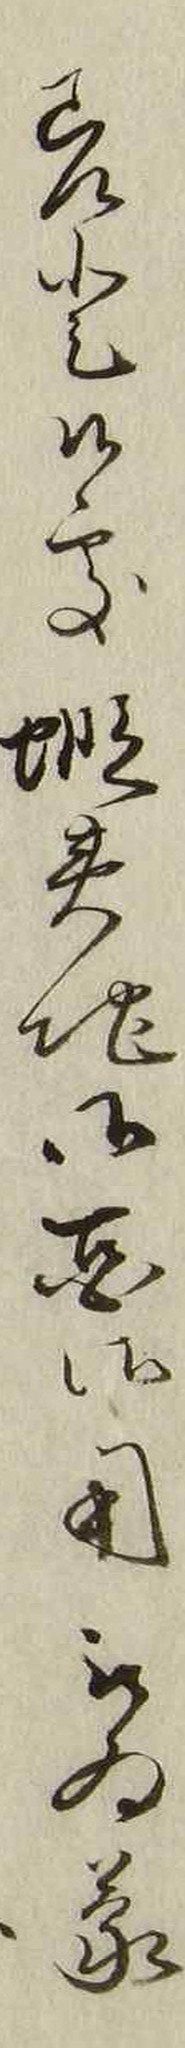差登候処蝦夷地御固御用被為蒙
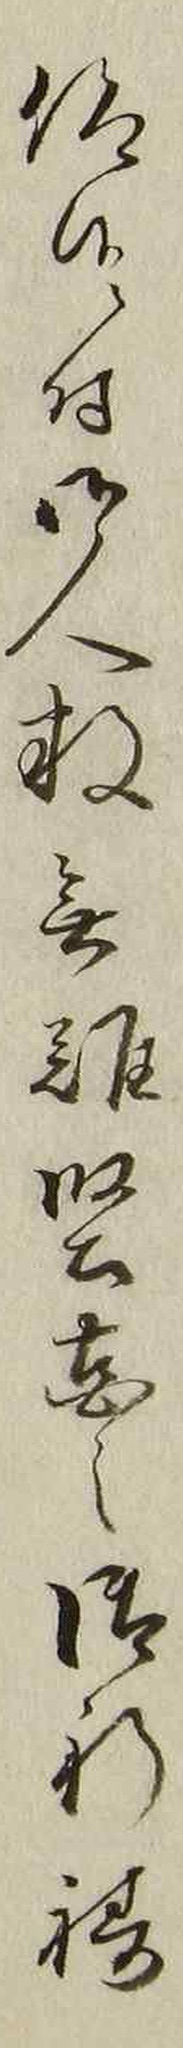仰候付御人数無難堅固之御祈祷
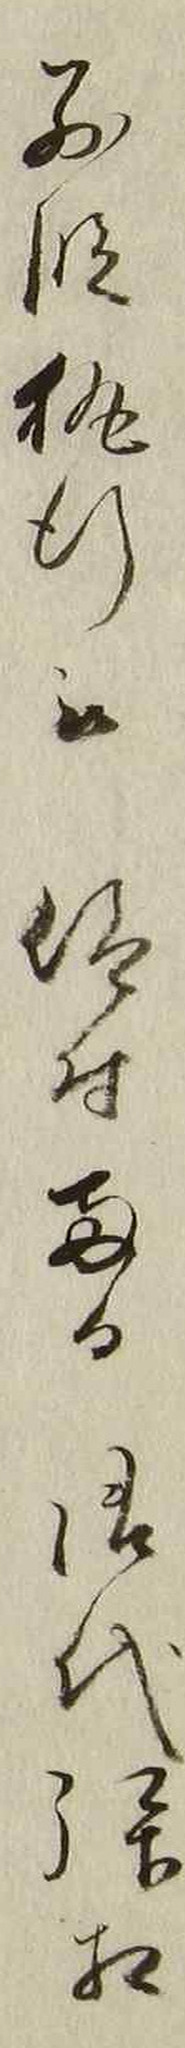別段執行被仰付両日御代拝相
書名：諸士系譜　巻之10　い之部10
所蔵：会津若松市立会津図書館
